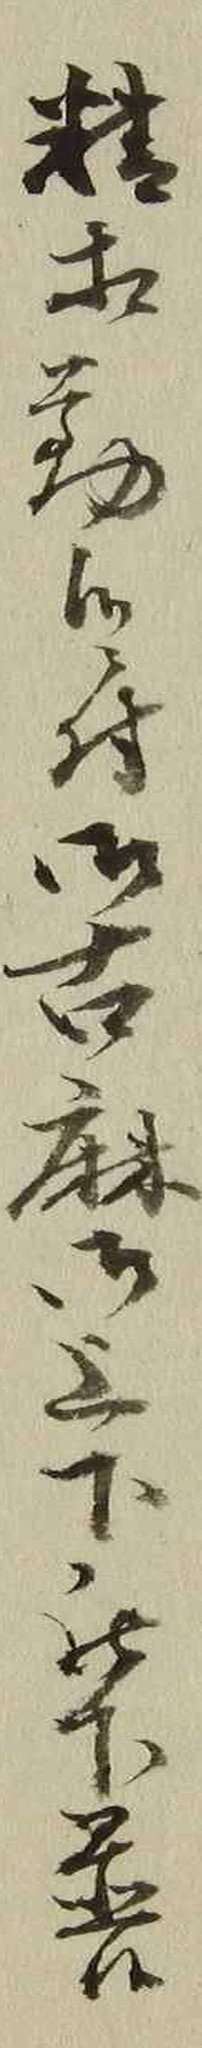精相勤候ニ付御古麻御上下被下置候
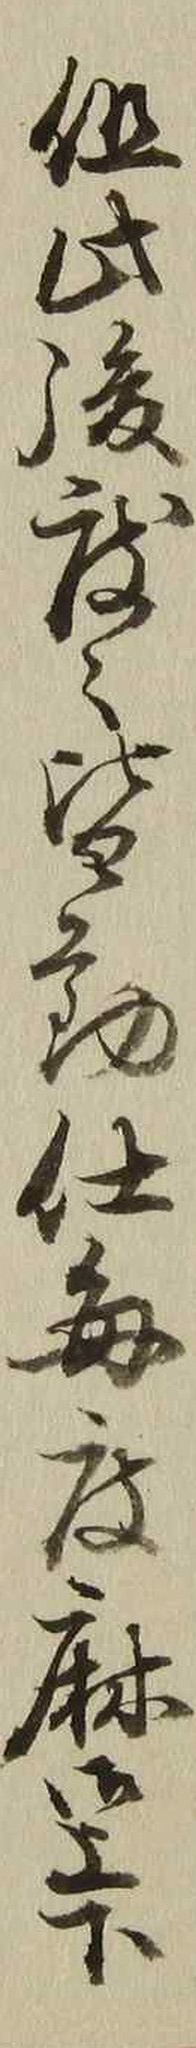但此後度々皆勤仕毎度麻御上下
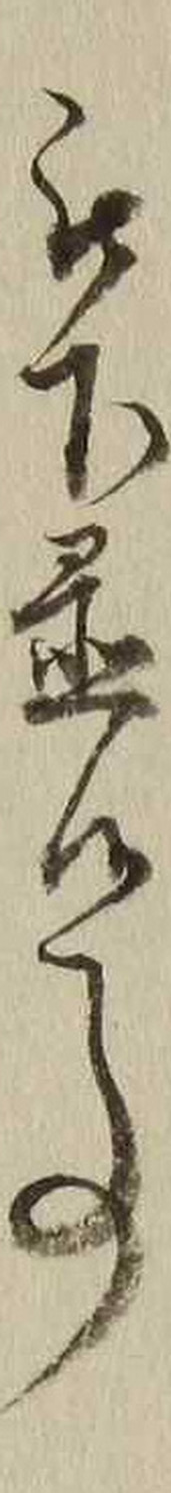被下置候事
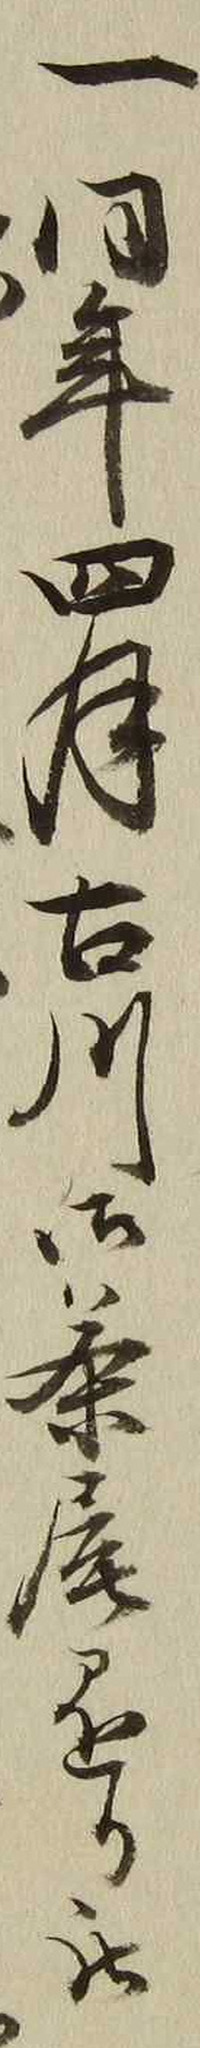一同年四月古川御茶屋懸り被
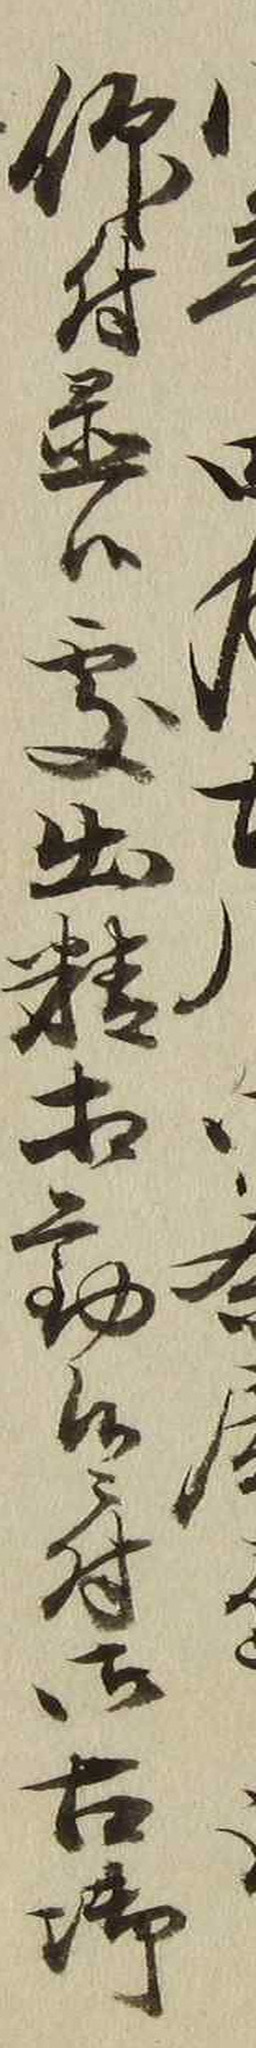仰付置候処出精相勤候付ニ御古御
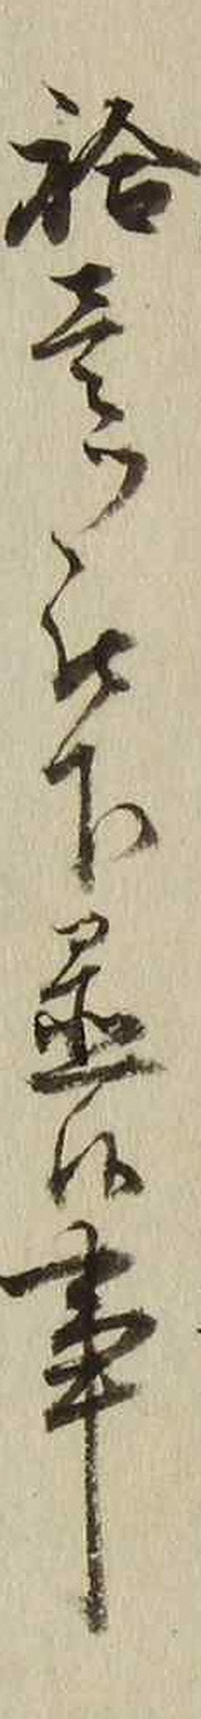袷壱ツ被下置候事
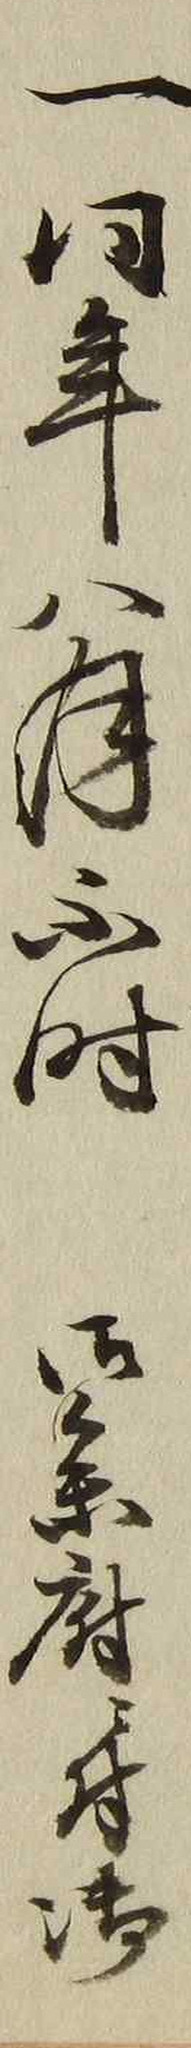一同年月八月不時御参府ニ付御
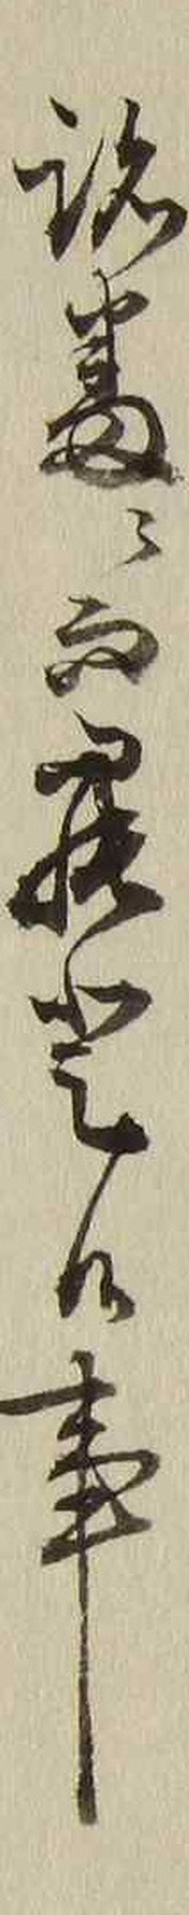跡番ニ而罷登候事
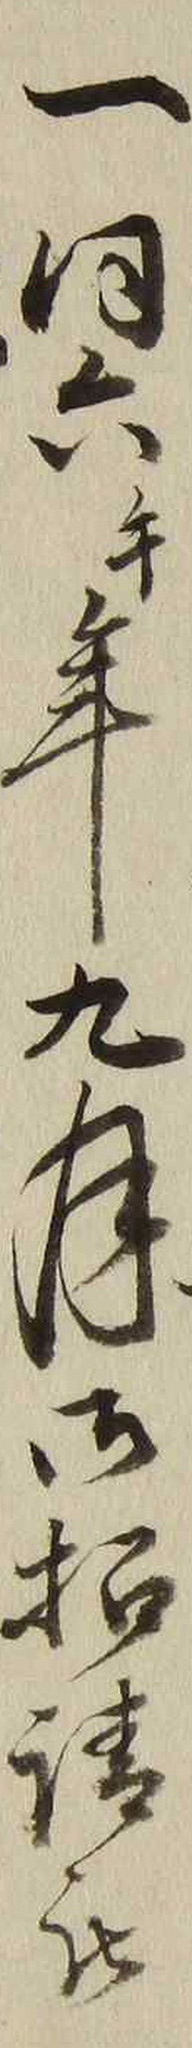一同六午年九月御招請被
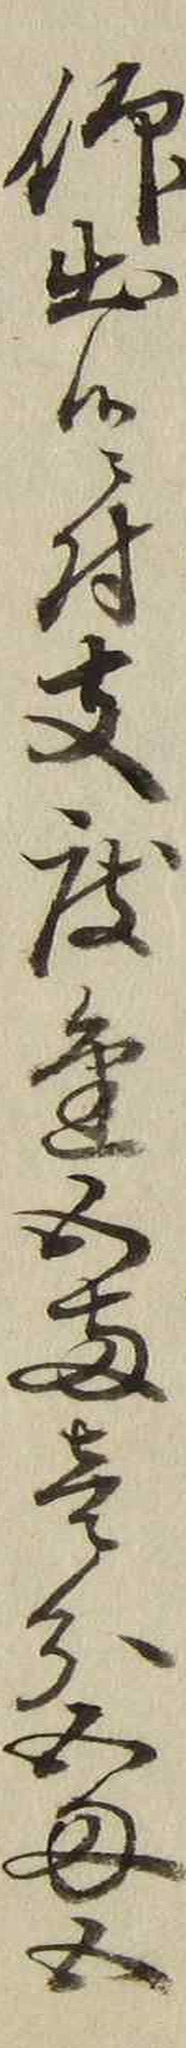仰出候ニ付支度金五両壱分五匁五
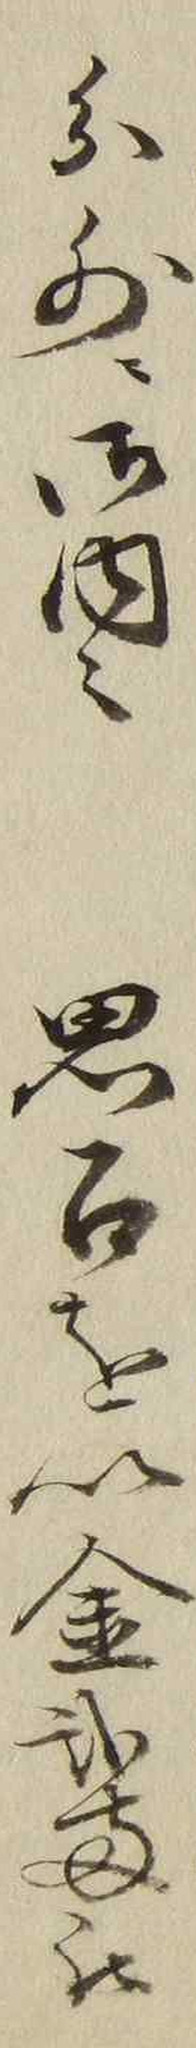分外ニ御内々思召を以金弐両被

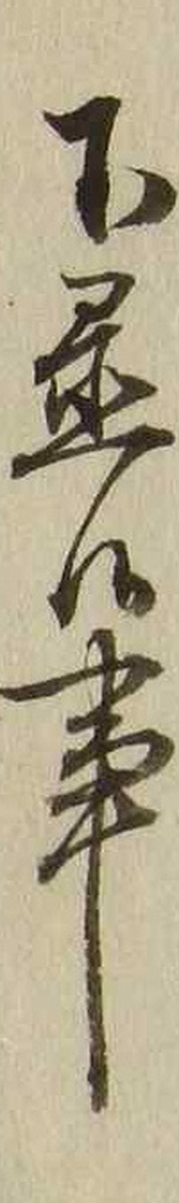下置候事
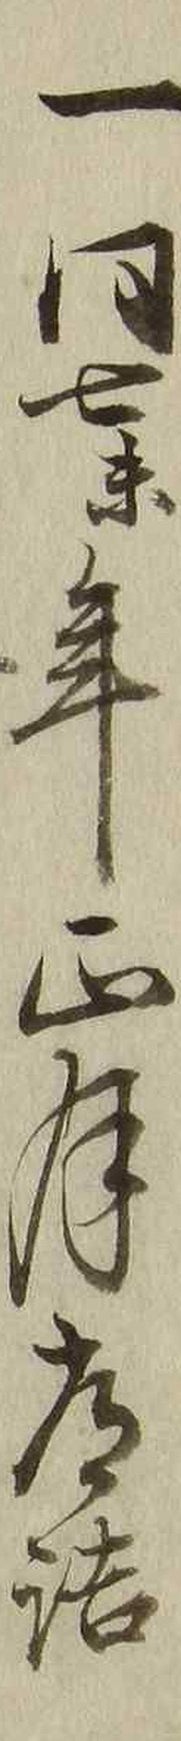一同七未年正月常詰
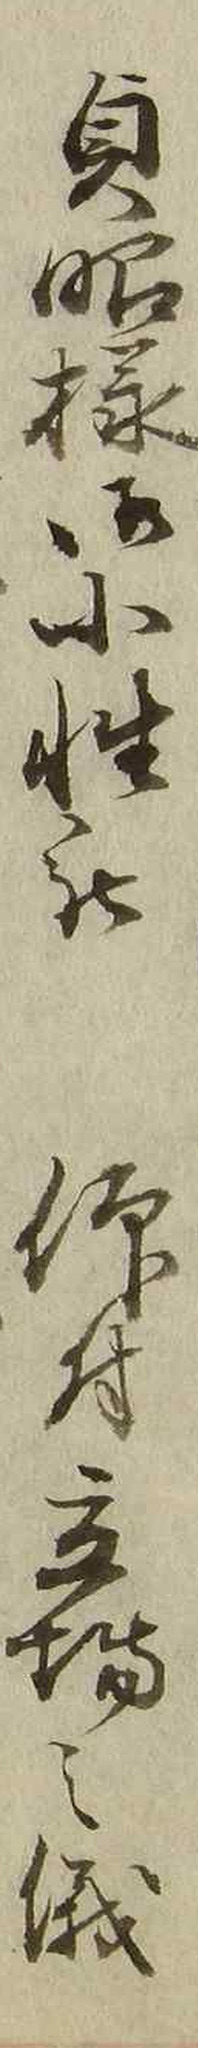貞昭様御小性被仰付立場之儀
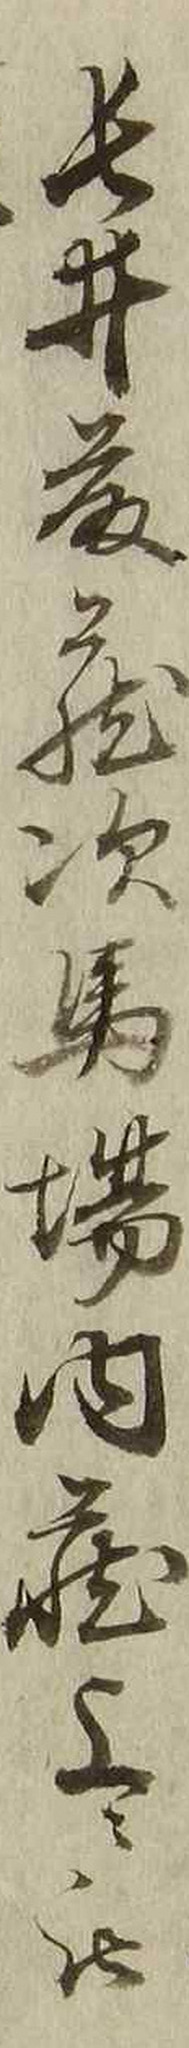長井藤蔵次馬場内蔵上ニ被
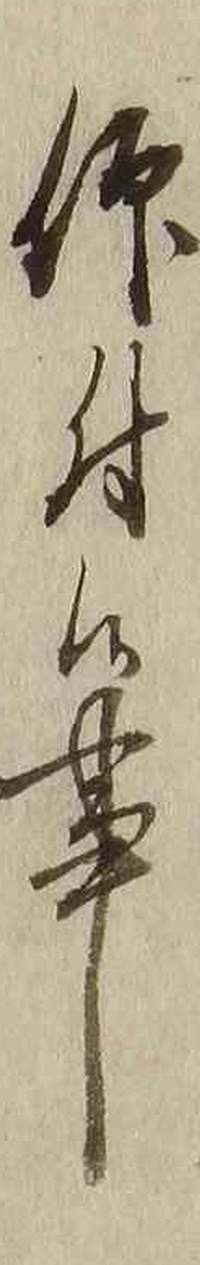仰付候事
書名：諸士系譜　巻之36　は之部4
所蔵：会津若松市立会津図書館
